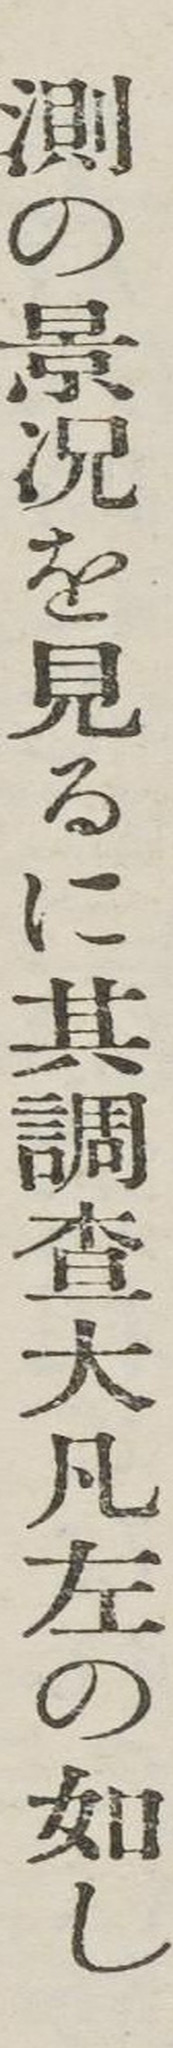測の景況を見るに其調査大凡左の如し
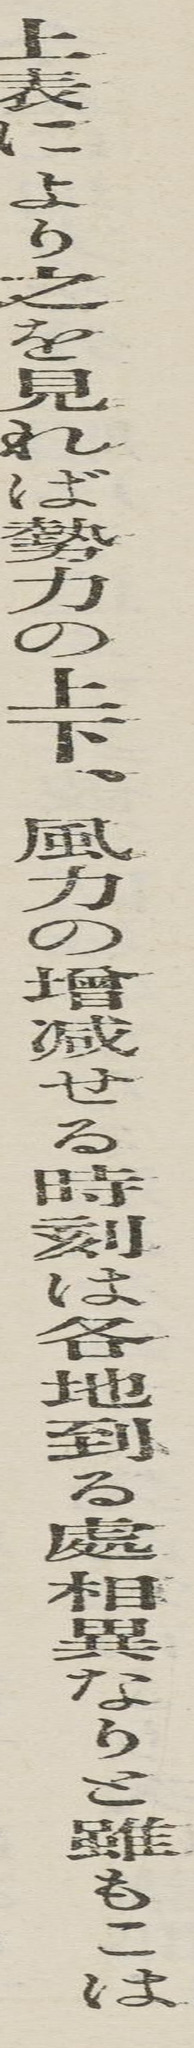上表により之を見れば勢力の上下、風力の増減せる時刻は各地到る処相異なりと雖もこは
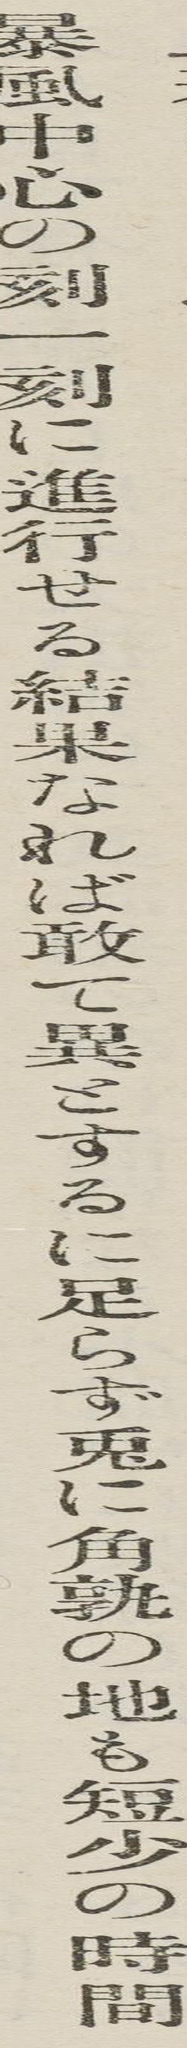暴風中心の刻一刻に進行せる結果なだば敢て異とするに足らず兎に角孰の地も短少の時間
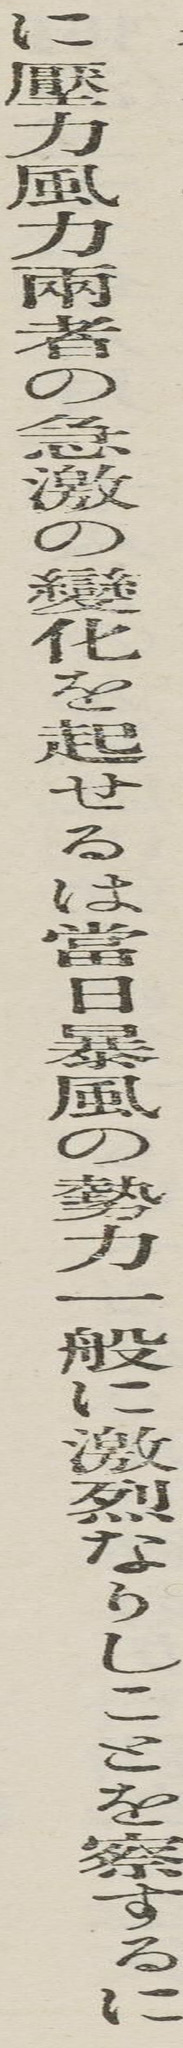に圧力風力両者の急激の変化を起せるは当日暴風の勢力一般に激烈なりしことを察するに
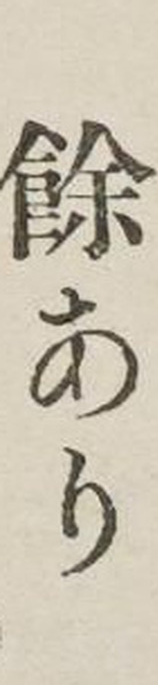余あり
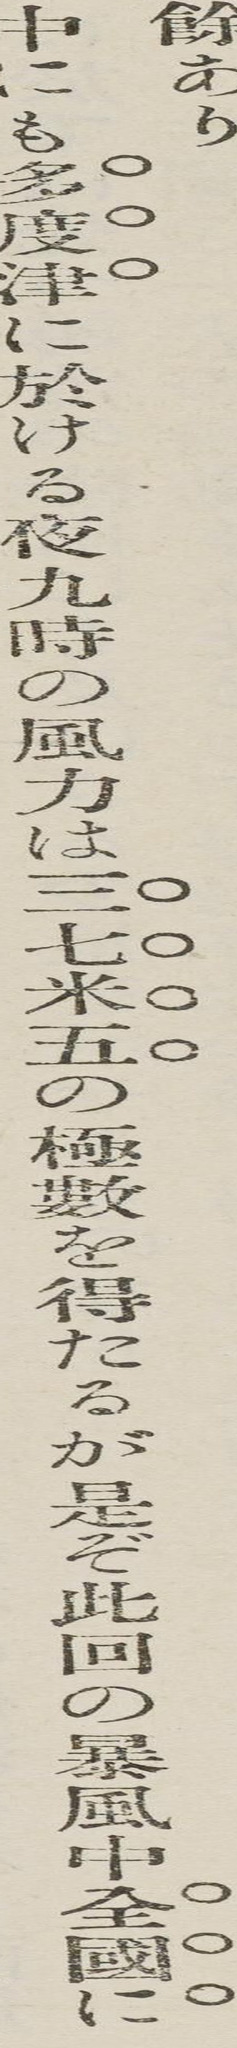中にも多度津に於ける夜九時の風力は三七米五の極数を得たるが是ぞ此回の暴風中全国に〇〇〇
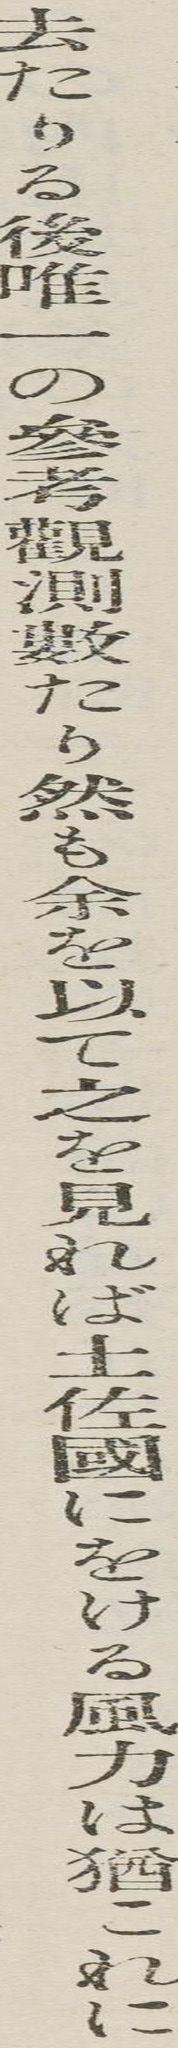去たりる後唯一の参考観測数たり然も余を以て之をみれば土佐国にをける風力は猶これに
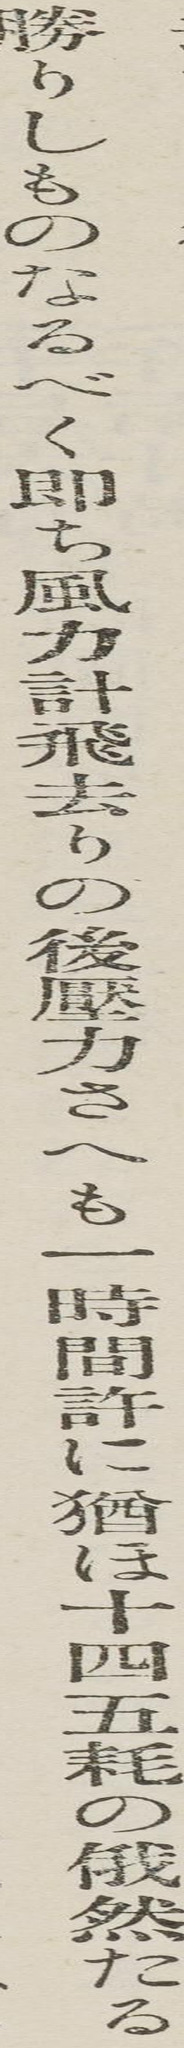勝りしものなるべく即ち風力計飛去りの後圧力さへも一時間許に猶ほ一四五粍の俄然たる
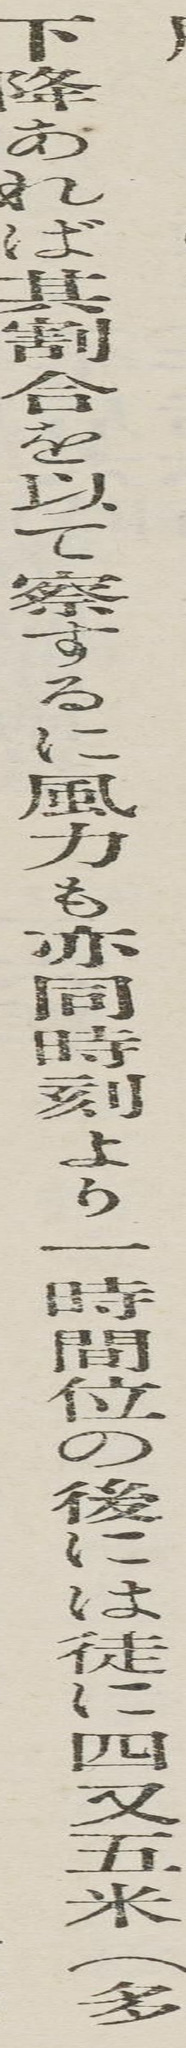下降あれば其割合を以て察するに風力も亦同時刻より一時間位の後には徒に四又五米（多
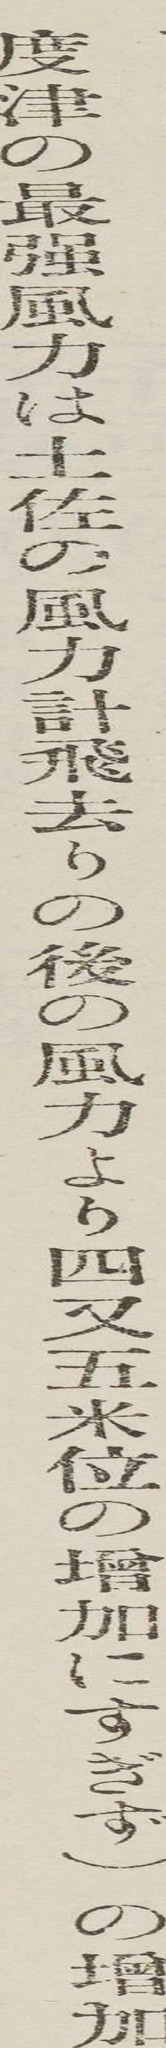度津の最強風力は土佐の風力計飛去りの後の風力より四又五米位の増加にすぎず）の増加
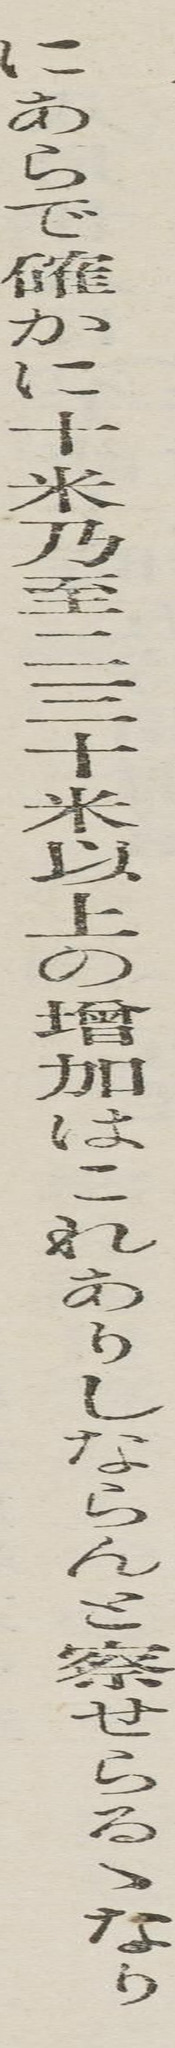にあらで確かに十米乃至二三十米以上の増加はこれありしならんと察せらるゝなり
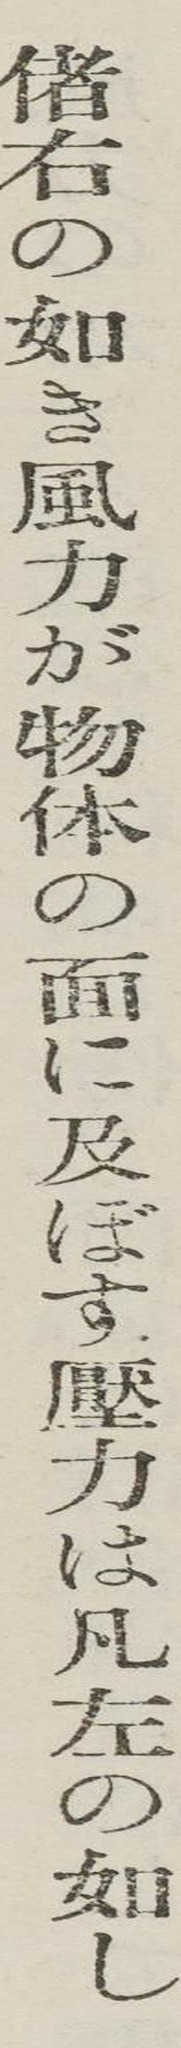偖右の如き風力が物体の面に及ぼす圧力は凡左の如し
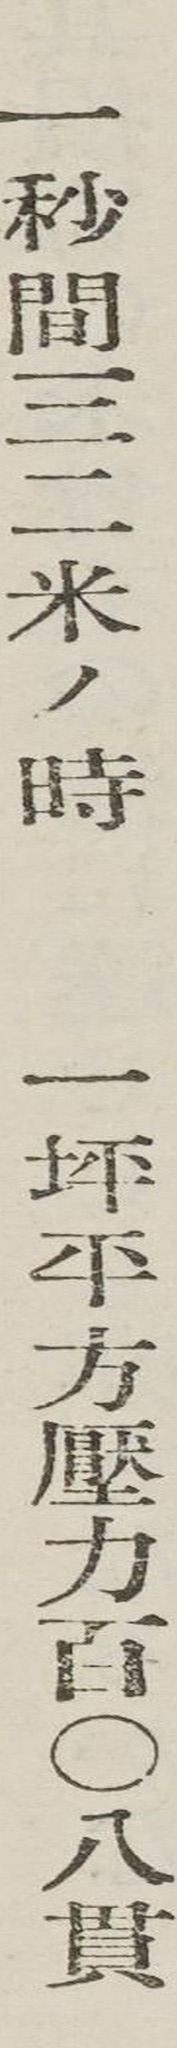一秒間三二米ノ時一坪平方圧力百〇八貫
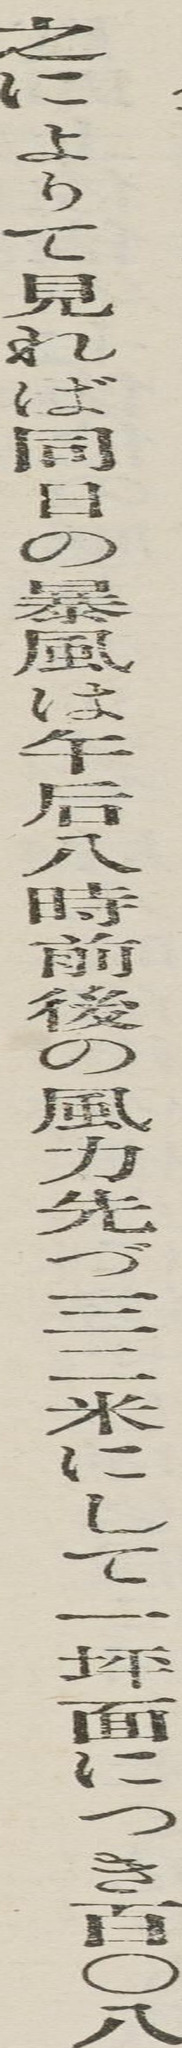之によりて見れば同日の暴風は午后八時前後の風力先づ三二米にして一坪面に付き百〇八

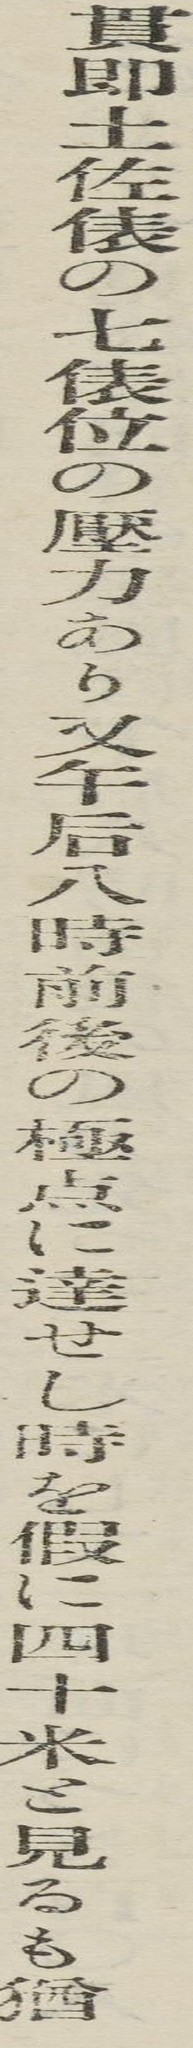貫即土佐俵の七俵位の圧力あり又午后八時前後の極点に達せし時を仮に四十米と見るも猶
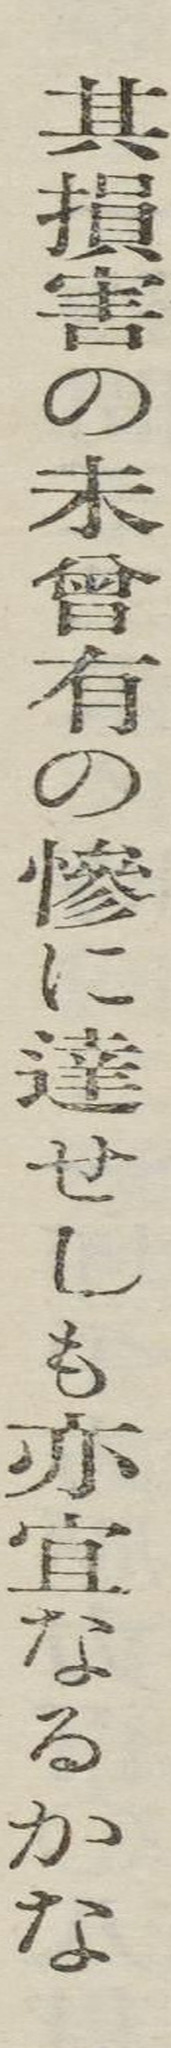其損害の未曾有の惨に達せしも亦宜なるかな
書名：土佐古今ノ地震
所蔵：東京大学地震研究所図書室 Earthquake Research Institute Library, The University of Tokyo, JAPAN
